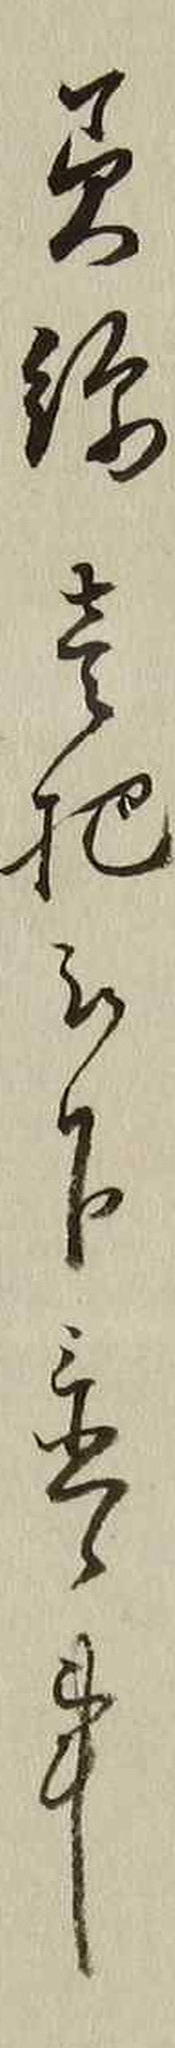美綿壱把被下置候事
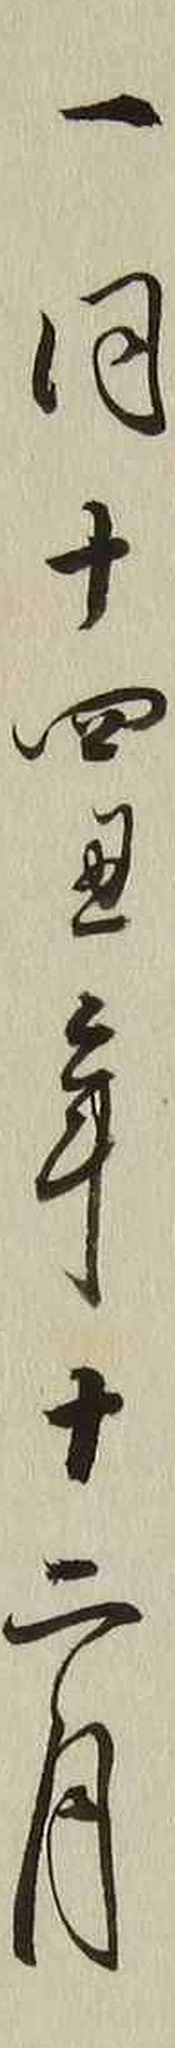一十四丑年十二月
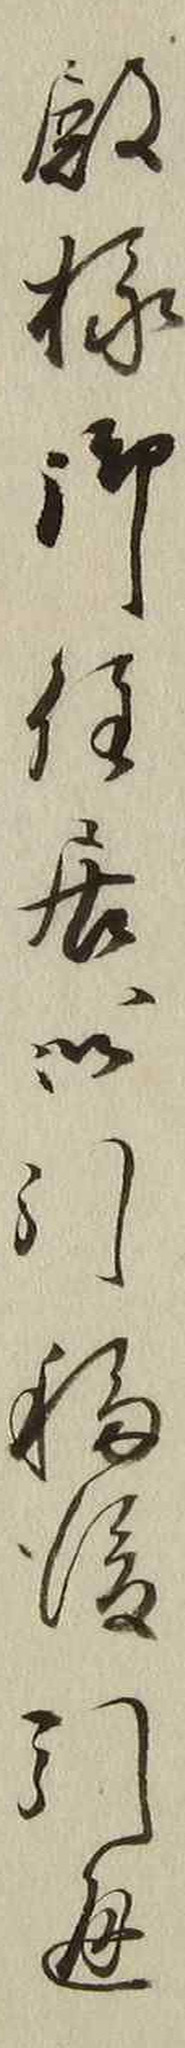殿様御住居へ引移後引通
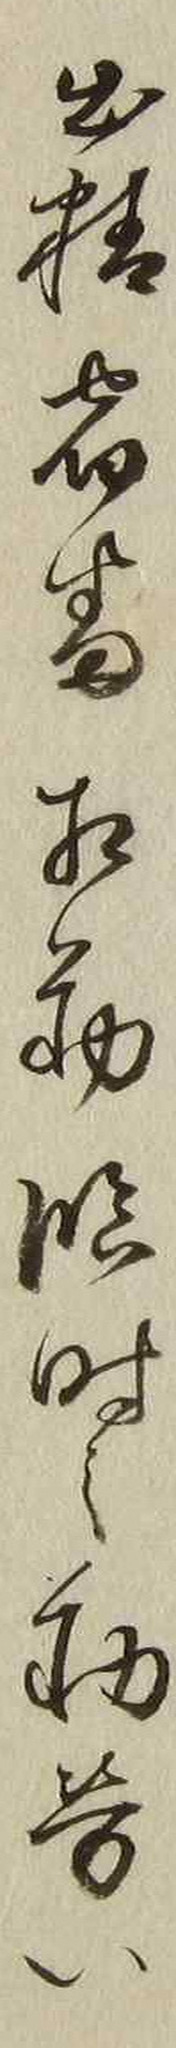出精宿番相勤臨時之勤労い
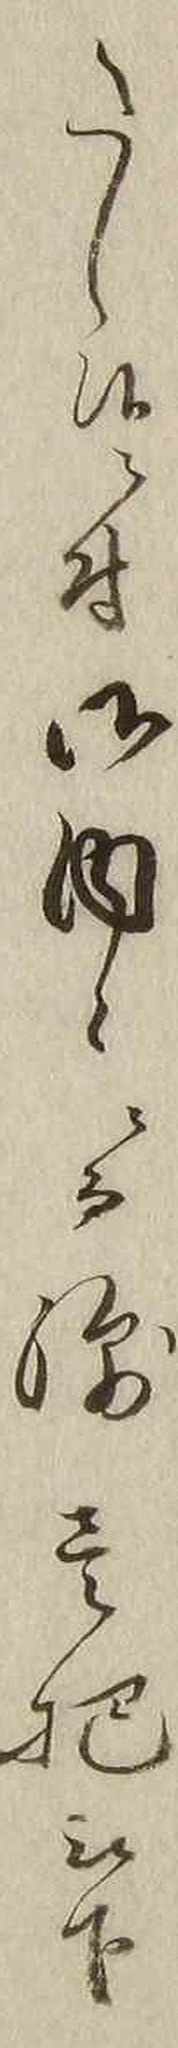たし候ニ付御内々ニ而綿壱把被下
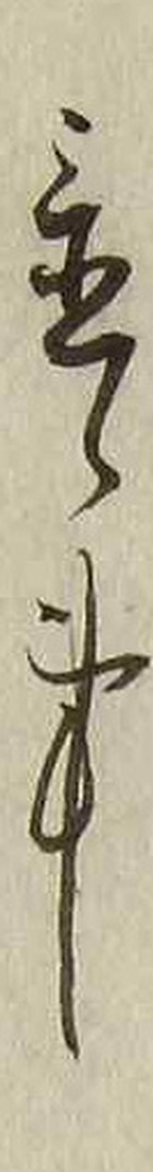置候事
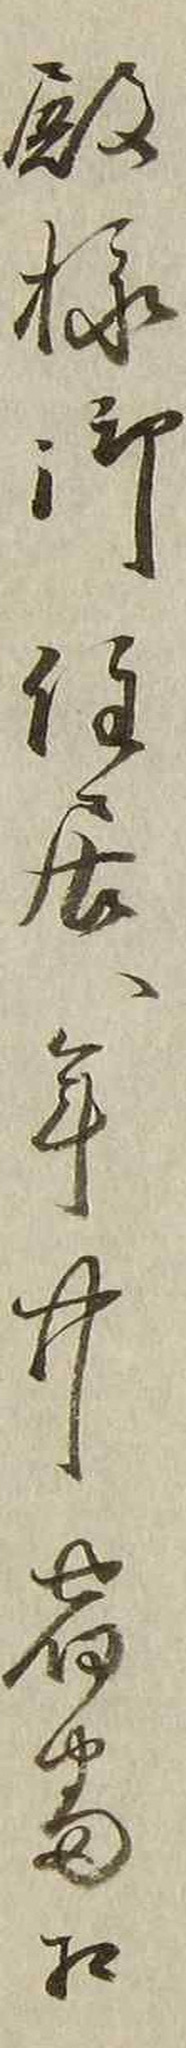殿様御住居へ年中宿番相
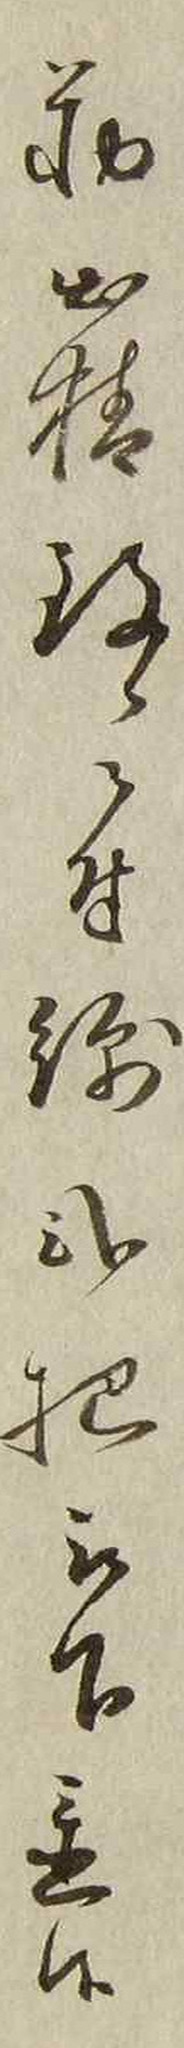勤出精致候ニ付綿弐把被下置候

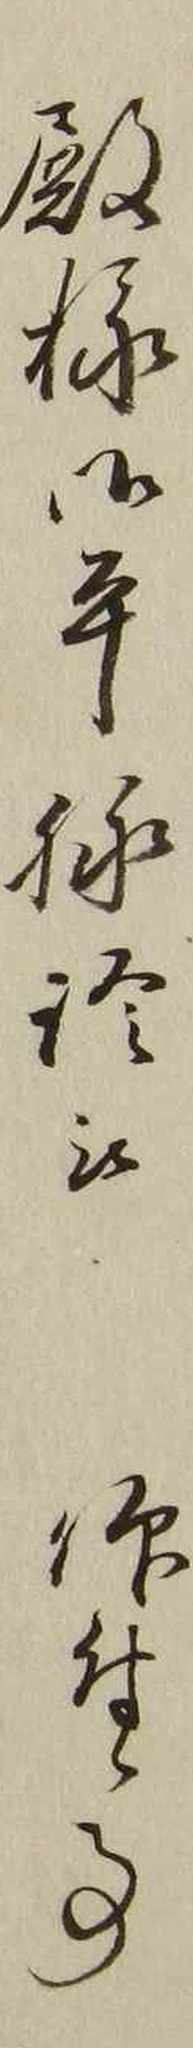殿様御平脈診被仰付候事
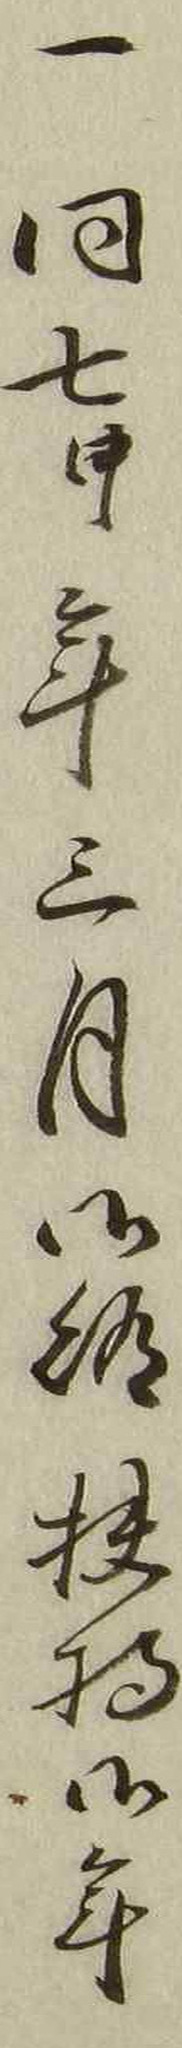一同七申年三月御賄扶持御年
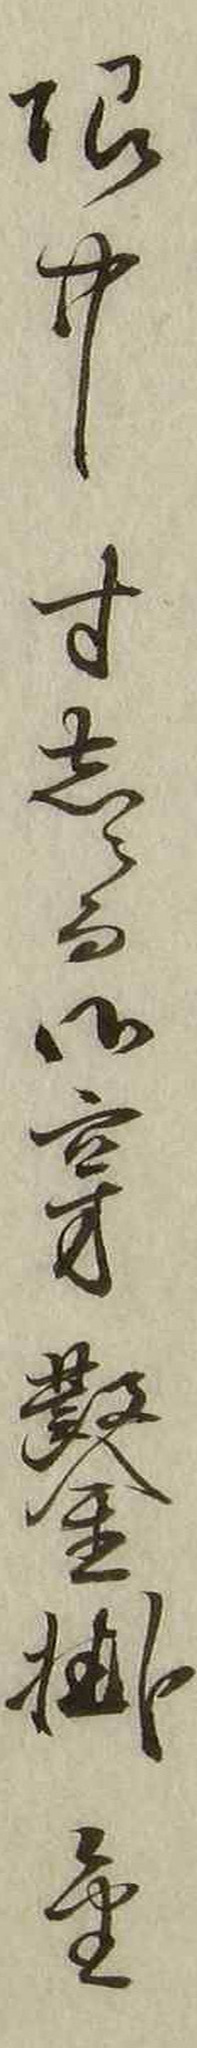限中寸志ニ而御穿鑿掛重
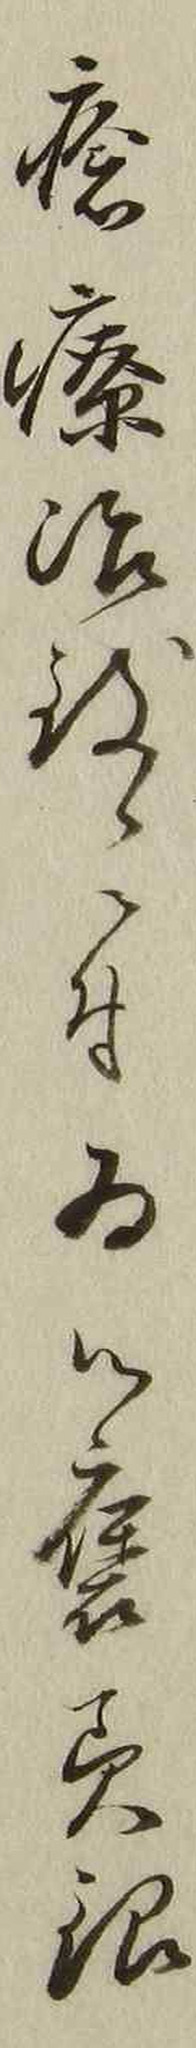瘡療治致候ニ付為御褒美銀
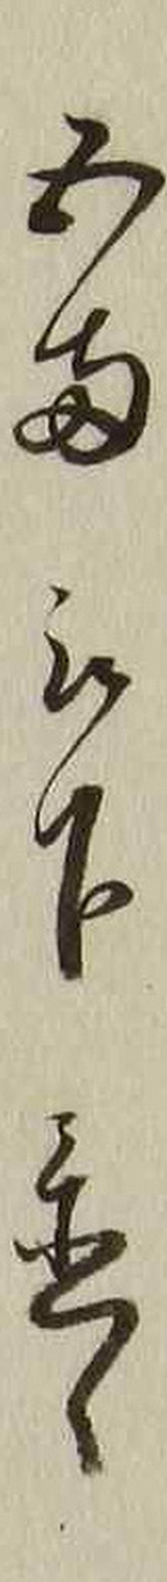五両被下置候
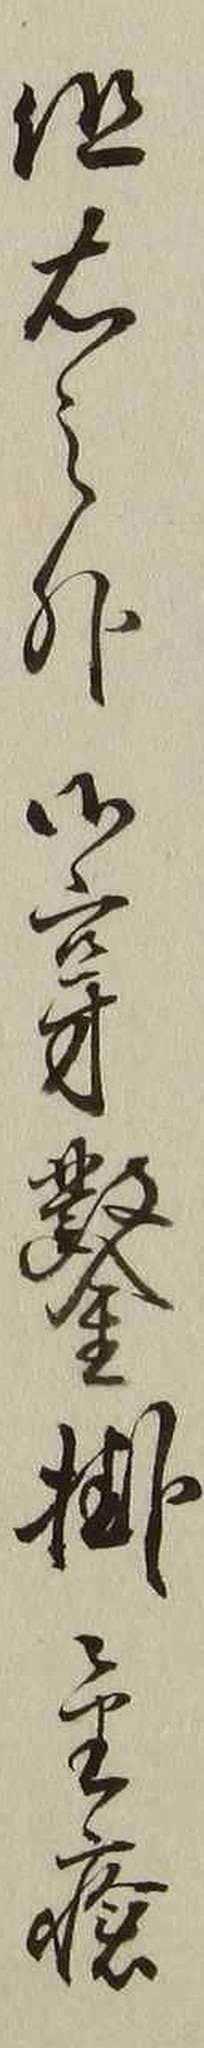但右之外御穿鑿掛重瘡
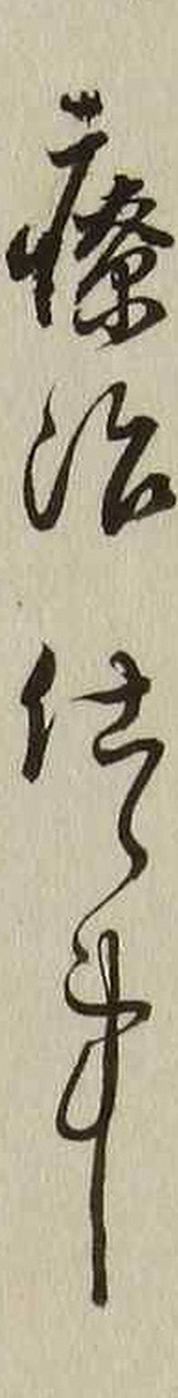療治仕候事
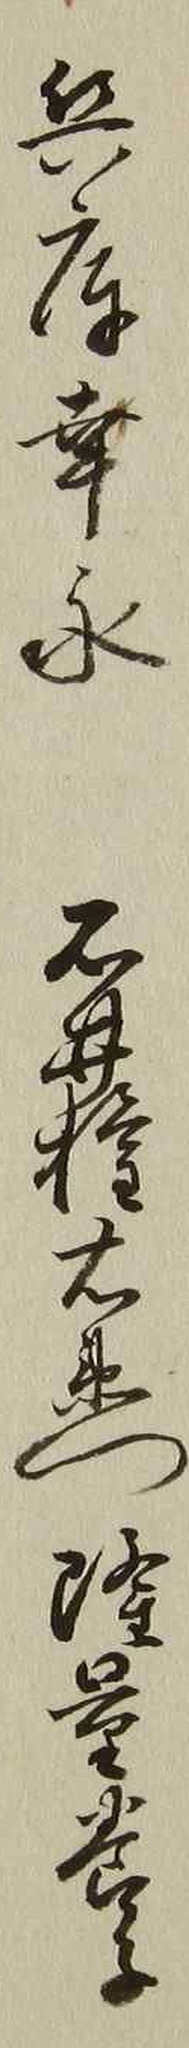兵庫幸永石井権右衛門隆量養子
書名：諸士系譜　巻之52　に之部3
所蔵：会津若松市立会津図書館
